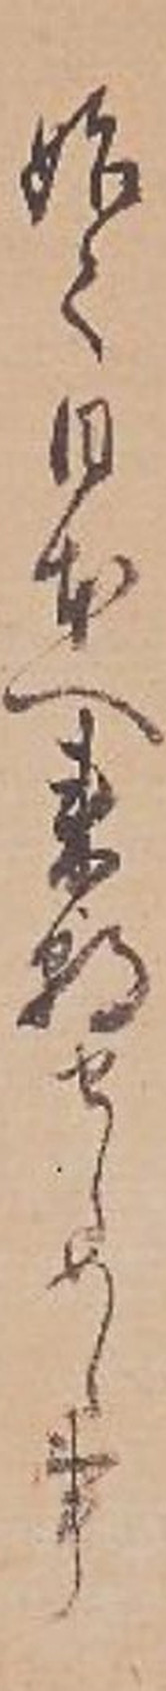始て日本へ来朝セしめ候事
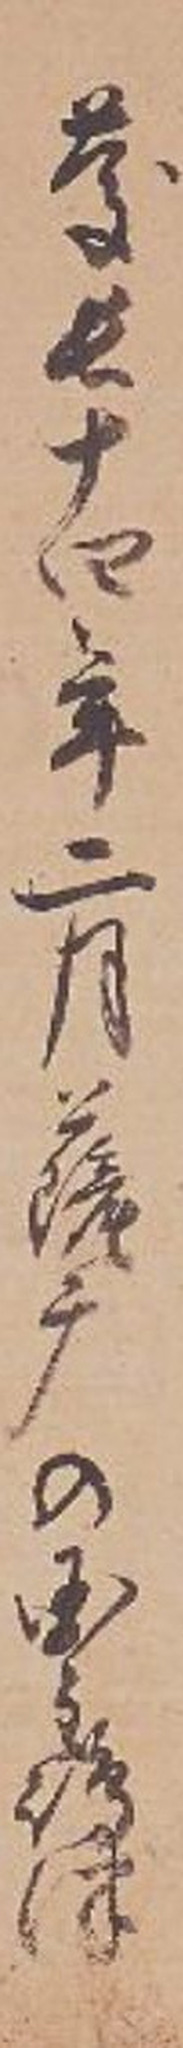慶長十四年二月薩摩の国主嶋津
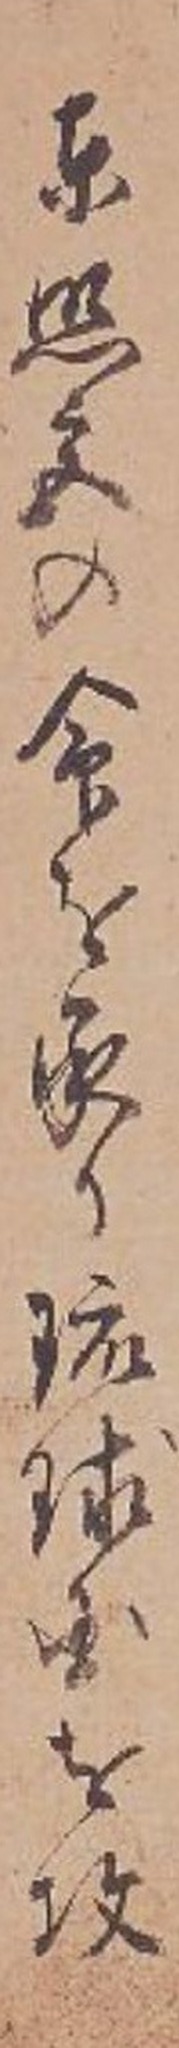東照宮の命を承り琉球国を攻

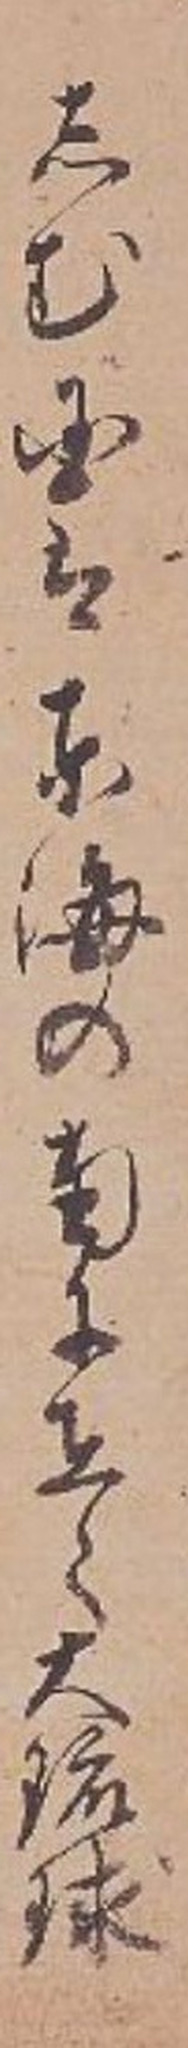しむ国は東海の南に在て大琉球
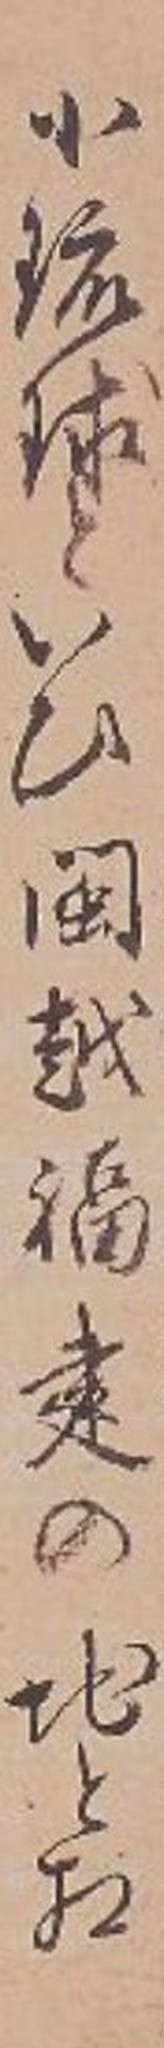小琉球といひ閩越福建の地と相
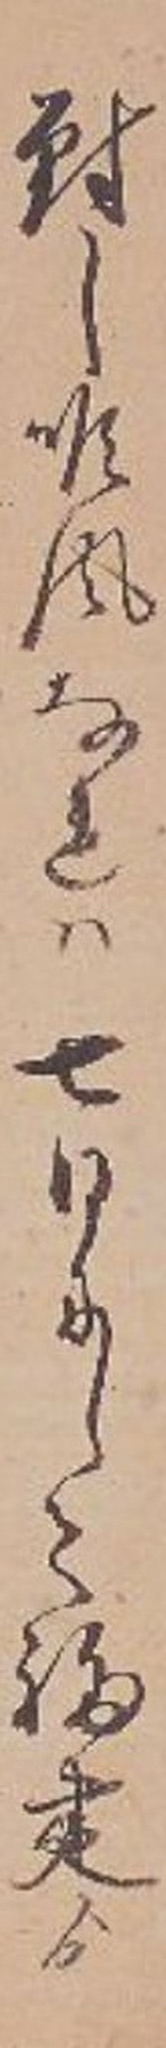対し順風なれは七日にして福建ゟ
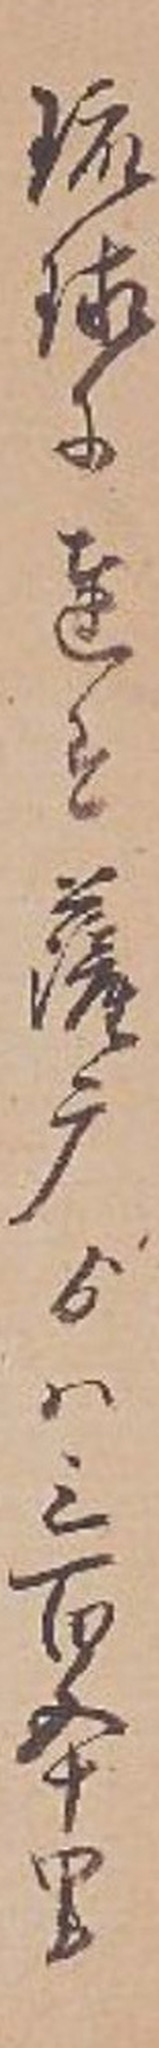琉球に達す薩摩ゟは三百五十里
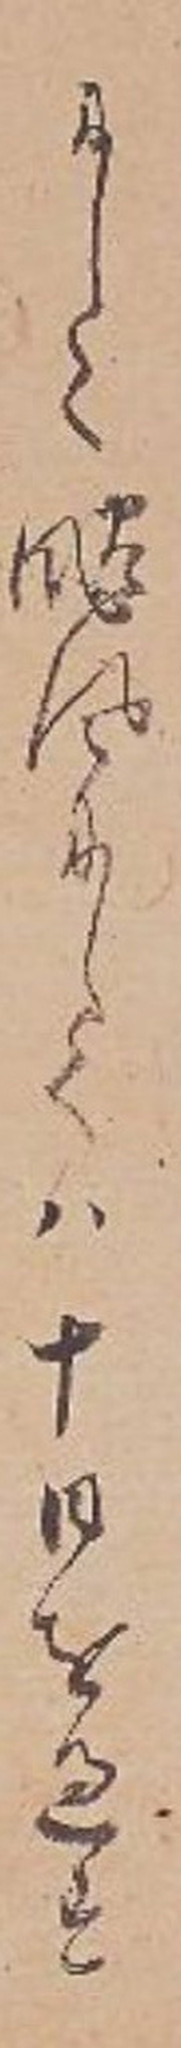にして颭風にしては十日を過す
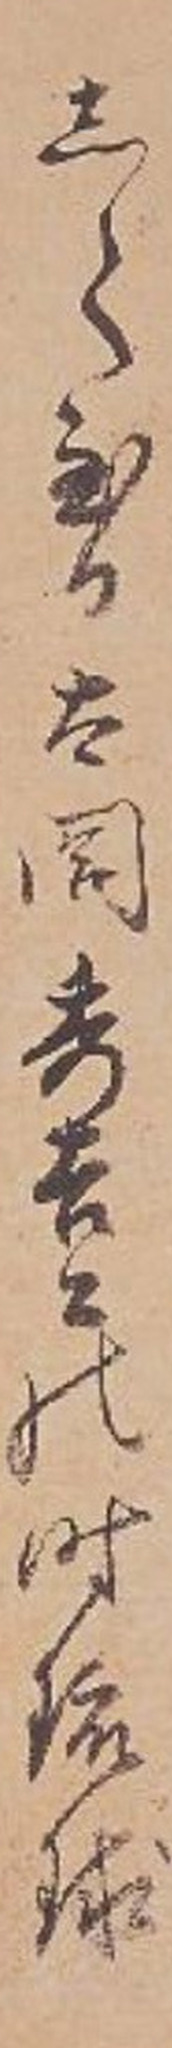して至り太閤秀吉公の時琉球
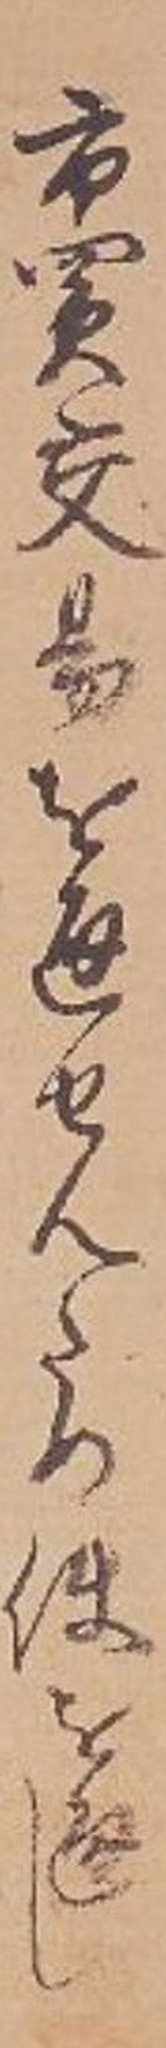市買交易を通せんため使を通し
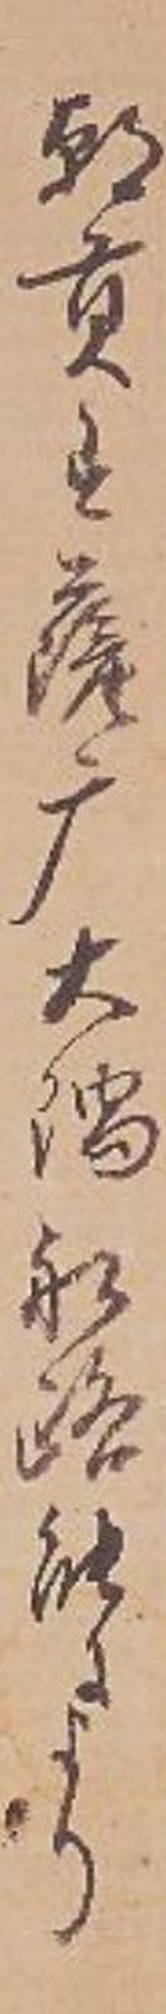朝貢す薩摩大隅船路能により
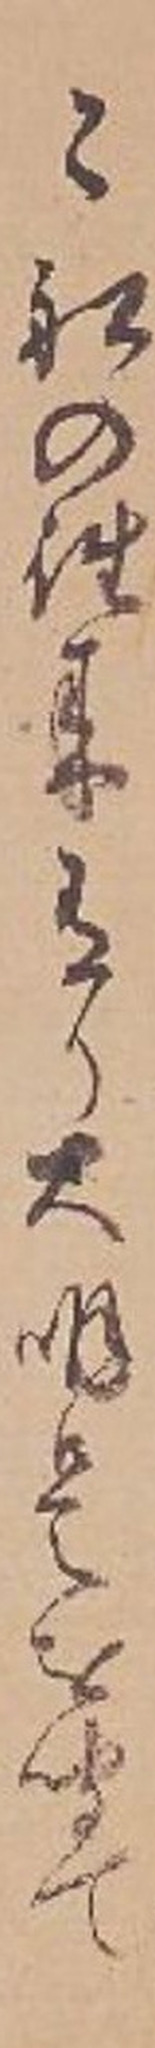こて船の往来有り大明是を聞て
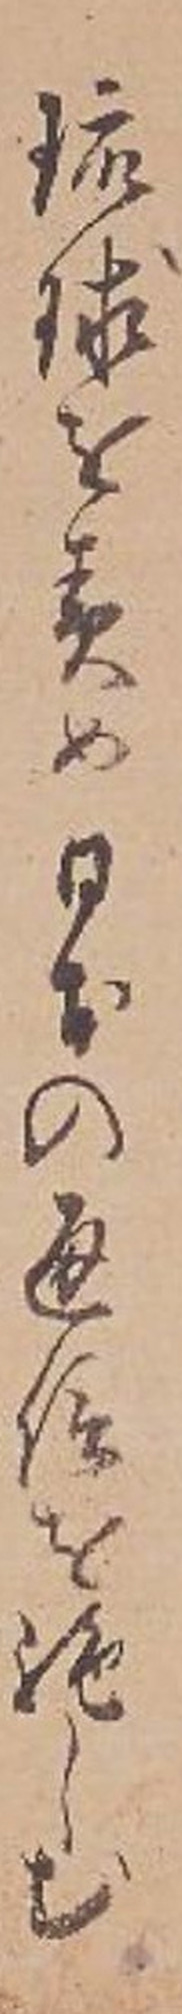琉球を責め日本の通信を絶しむ
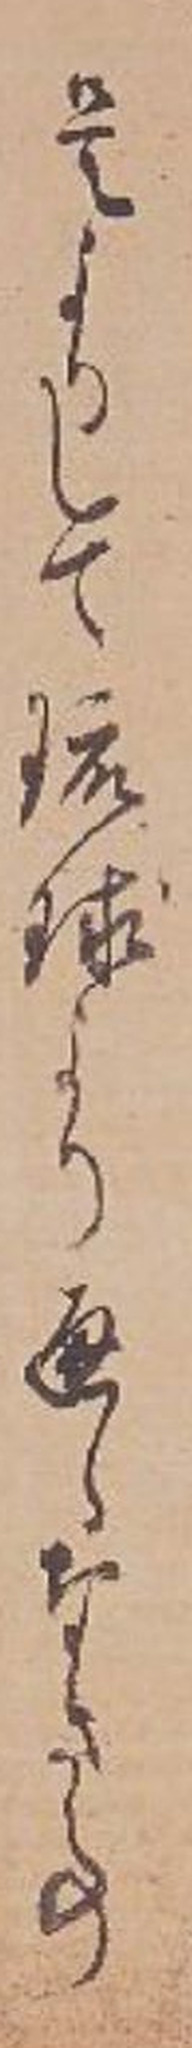是よりして琉球より通しなき事
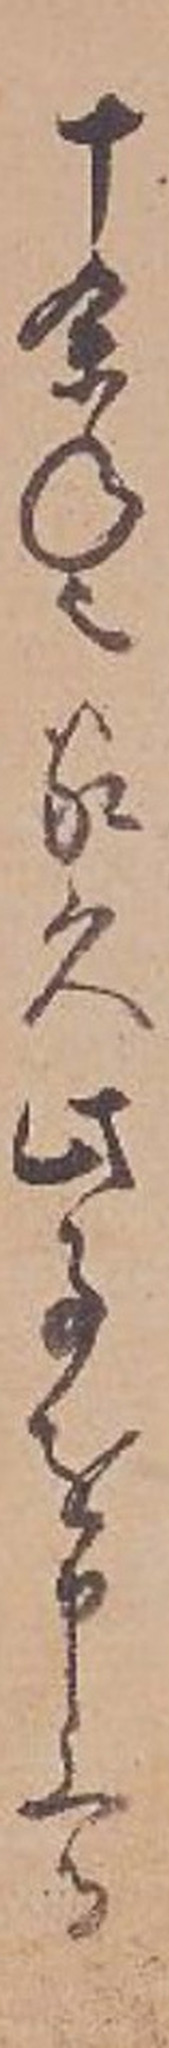十余年也家久此事を申上る

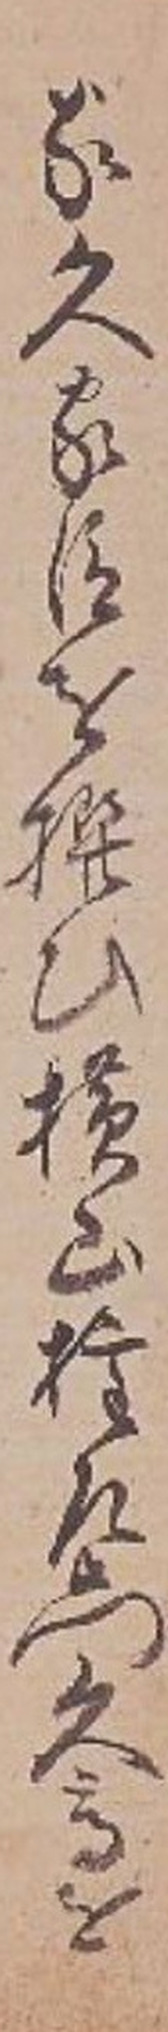家久家臣を撰ひ横山権左衛門久高を
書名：琉球人来朝記 一、二
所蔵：University of the Ryukyus Library
